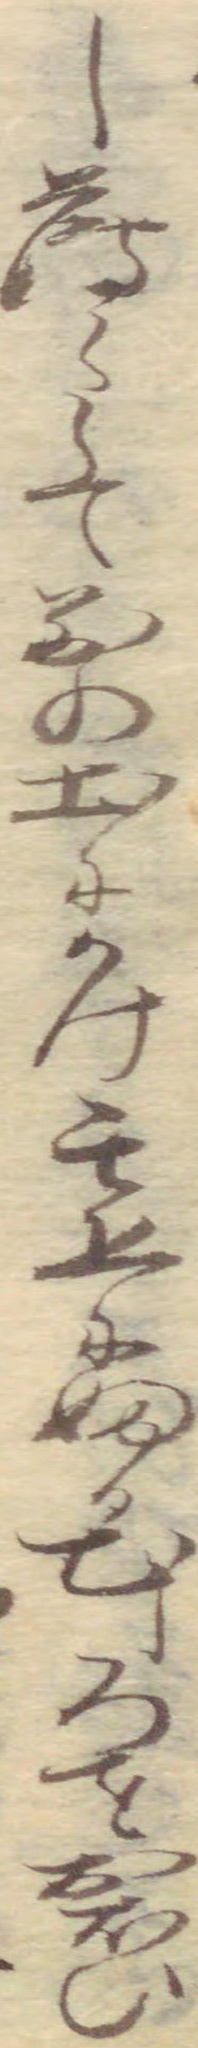し薄くして別の土にかけ其上にふるむしろをおほひ
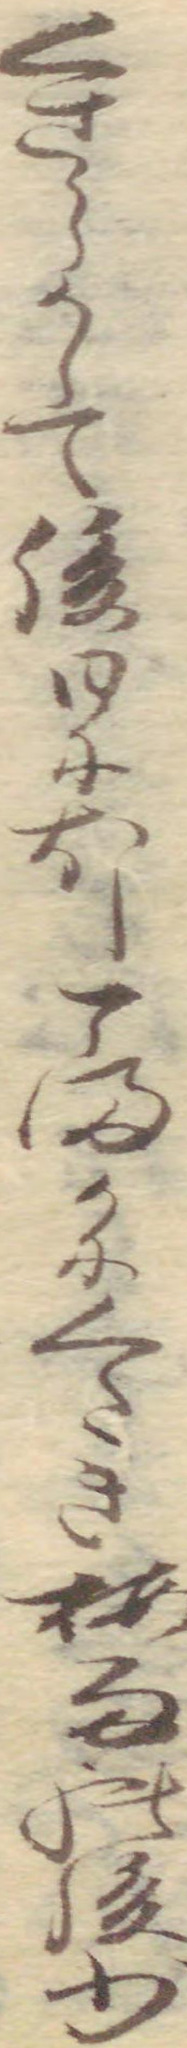くさらかして後日にほしこまかにくたき梅雨の後少
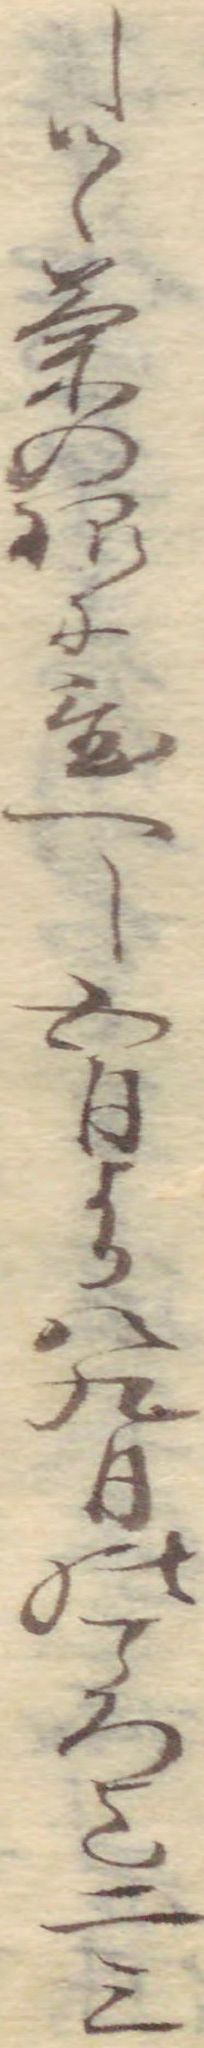しツヽ菊の根に置へし五月より八九月のころ迄二三
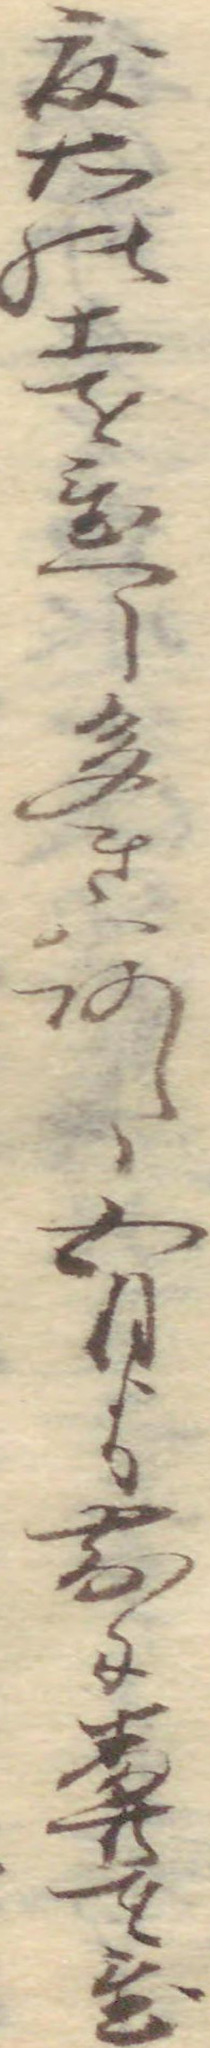度右の土を置へし多きハあし也五月より前に糞を置
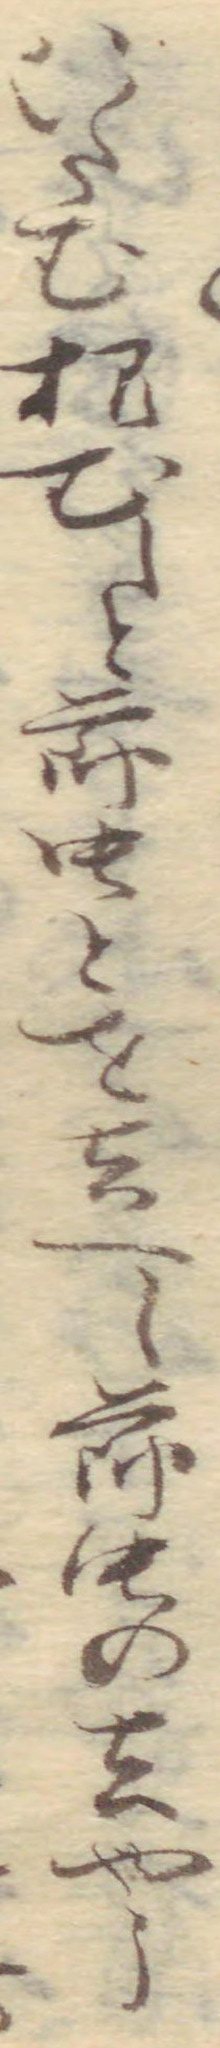ハいたむ根むしと節虫とを去へし節虫の去やう
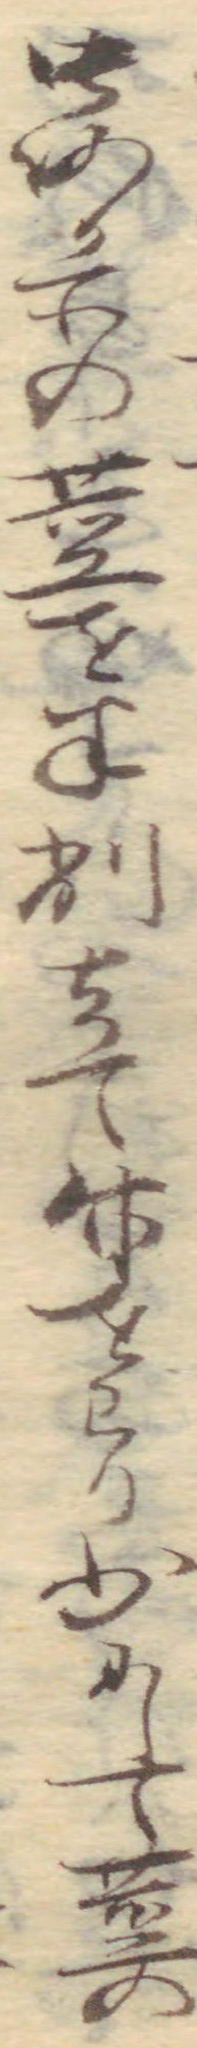虫あり所の茎を半削去て竹をわり少にして茎の
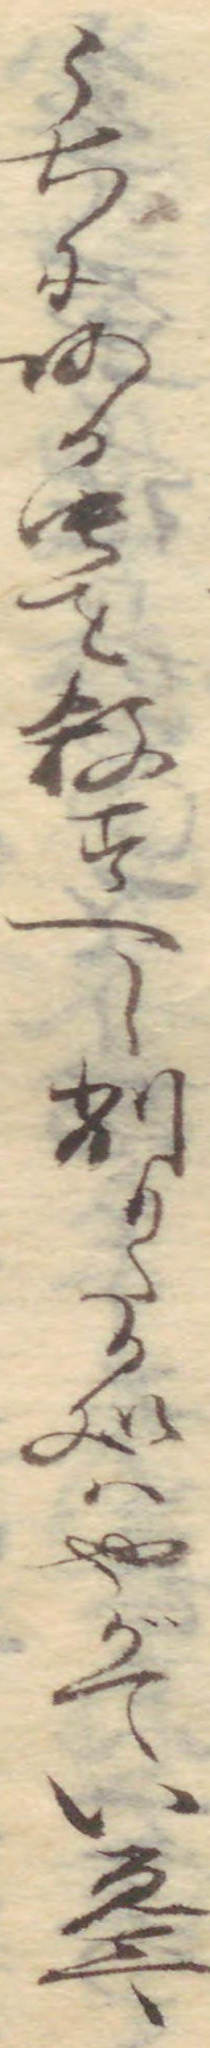うちにある虫を殺すへし削りたる処はやがていゑしゝ
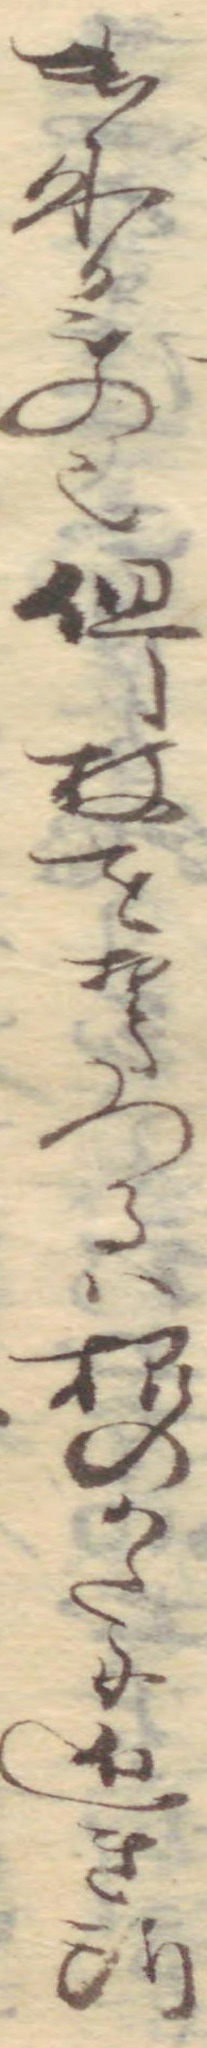出来るもの也但し枝をそたつるハ根のかたに近き所
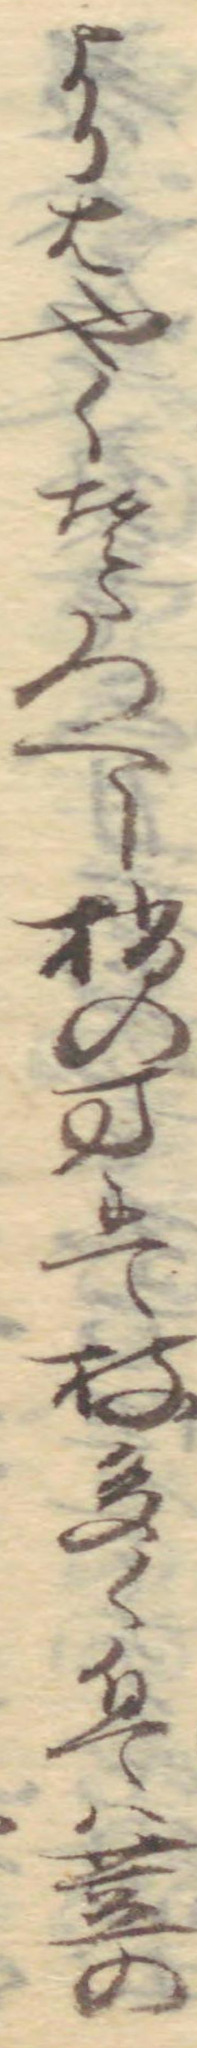よりはやくそたつへし梢の方にて枝多く付てハ茎の
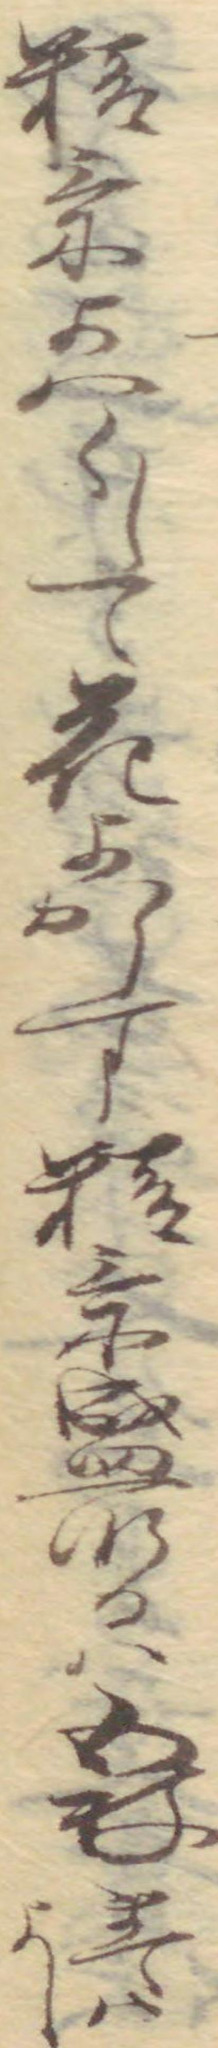精気よはくして花よからす精気盛なるハ五枚まてハよし
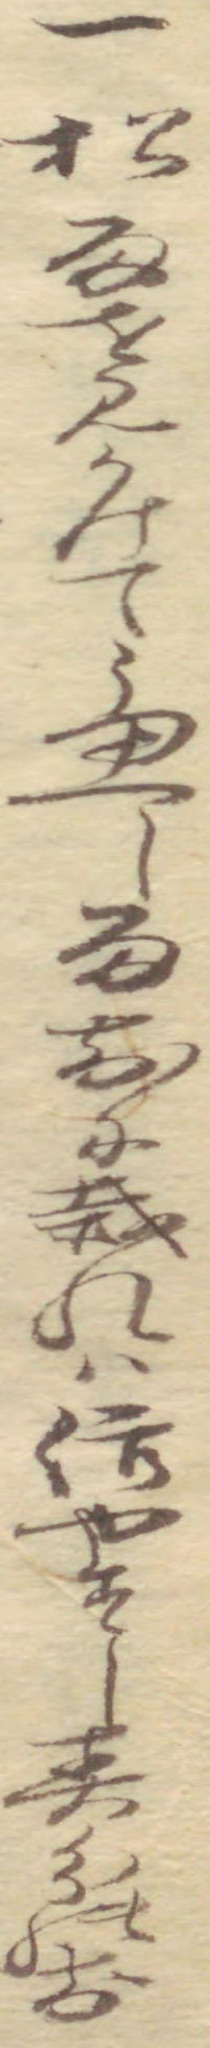一松雨を見かけてうゆへし雨前に栽れハ活やすし春分の前
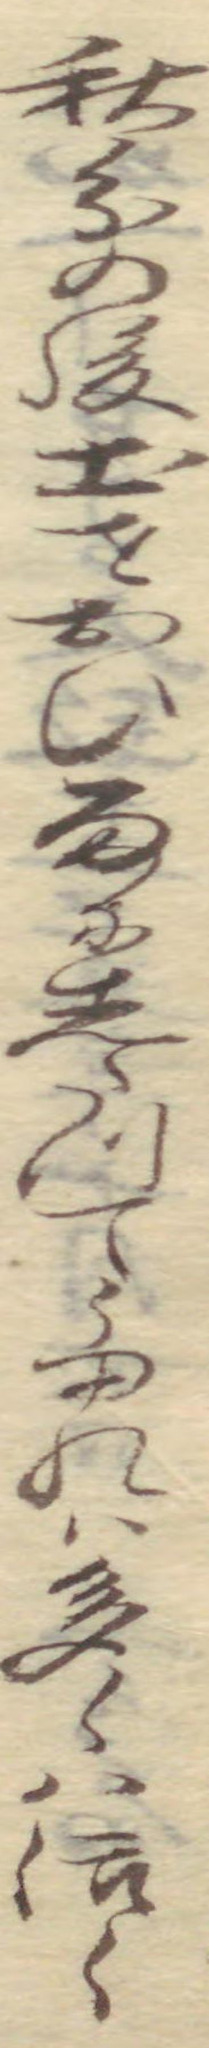秋分の後土をおひ雨に先たつてうゆれハ多くハ活く
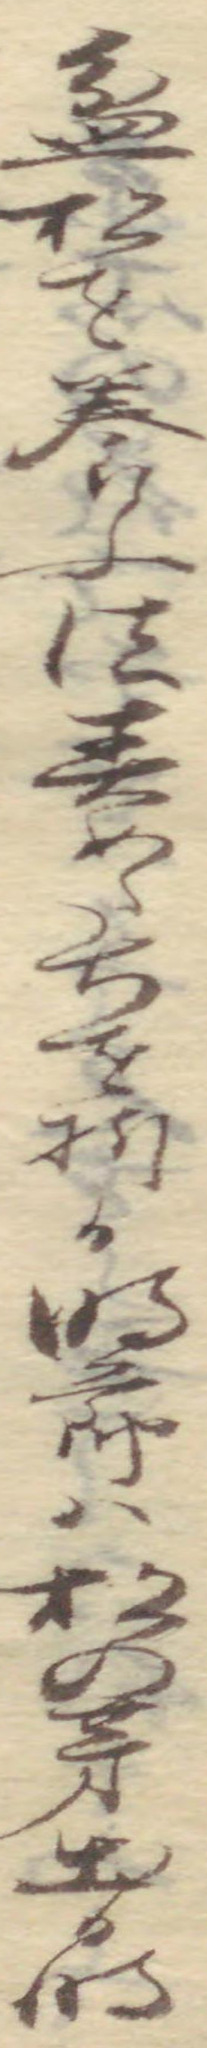盆松を養ふ法春めたちを折る時節ハ松の芽出る時
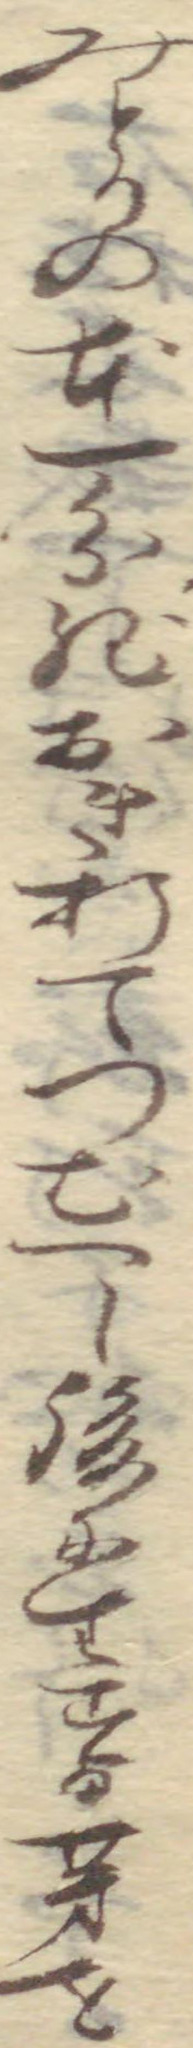みとりの本一分程おき折てつむへし後に生する芽を
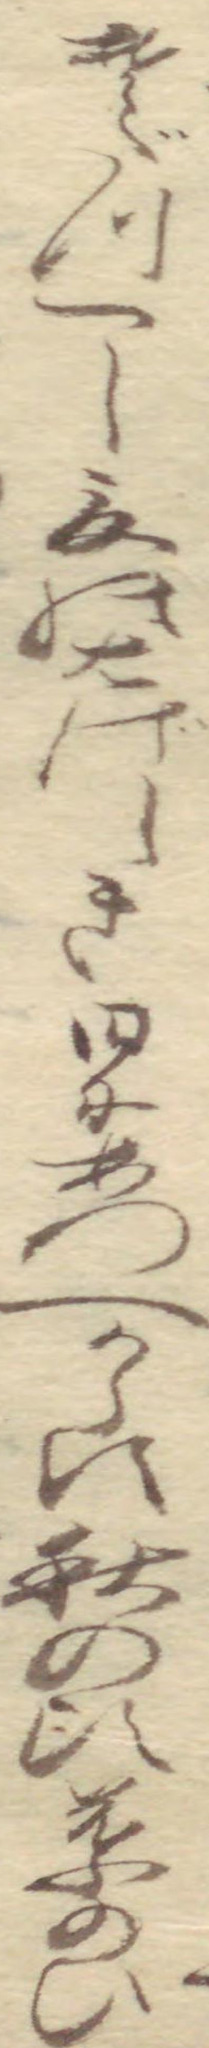そだつへし夏のはげしきひにあつへからへからす秋の頃葉のひ
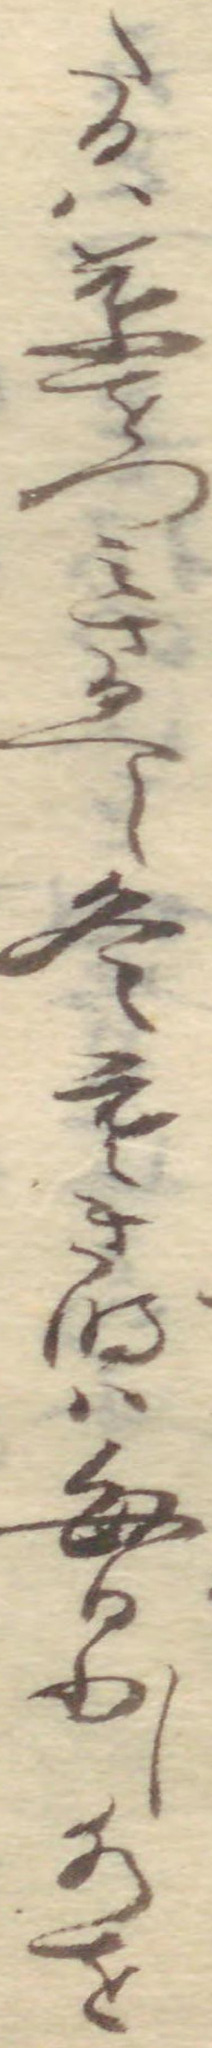たるハ葉をつミさるへし冬寒き時ハ毎日少し水を
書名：鶯宿雑記. 巻199-200
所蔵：国立国会図書館 National Diet Library, JAPAN
